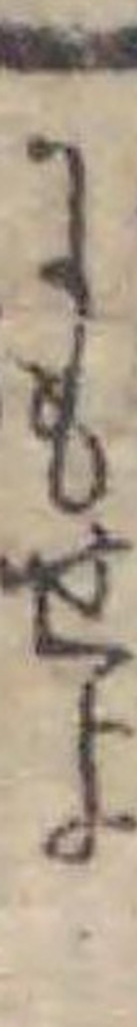にもせよ
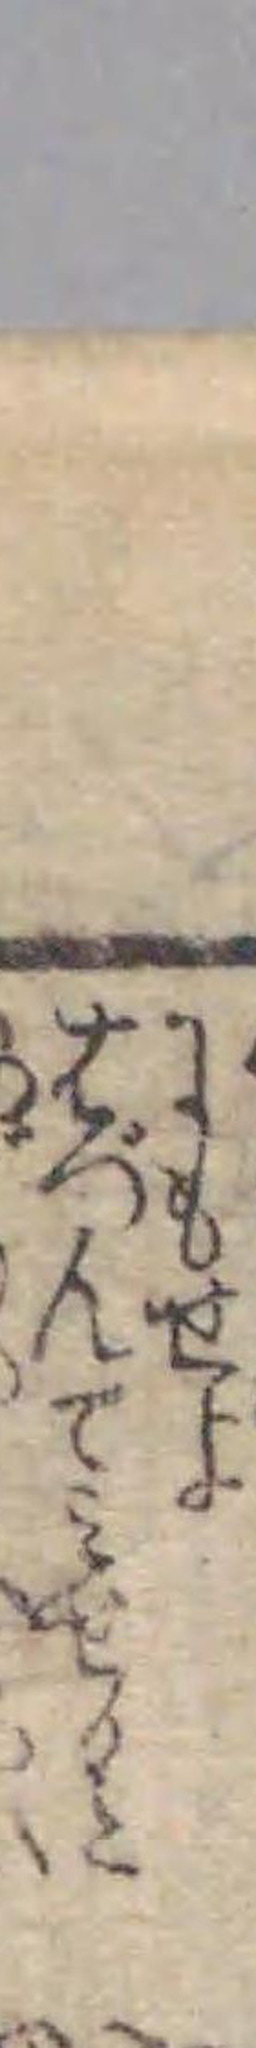はづんでみせると
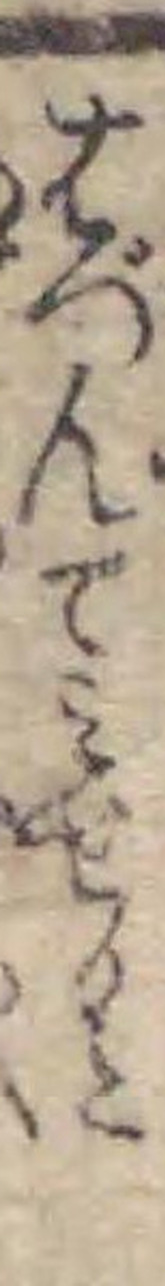はづんでみせると
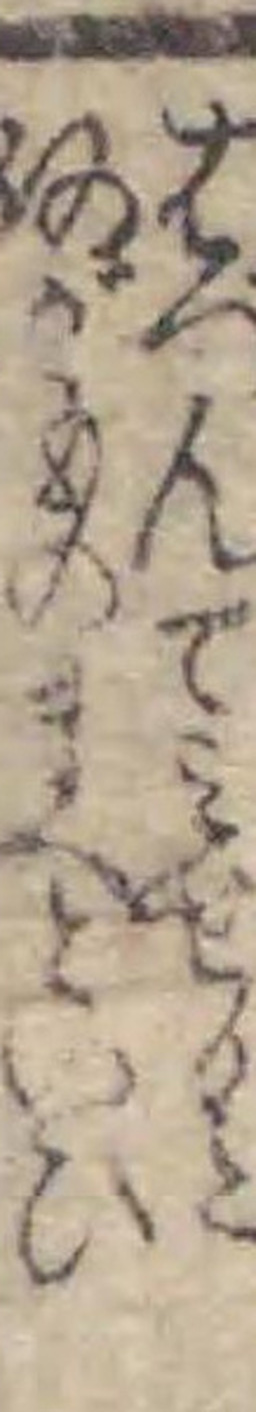何がものまへといひ
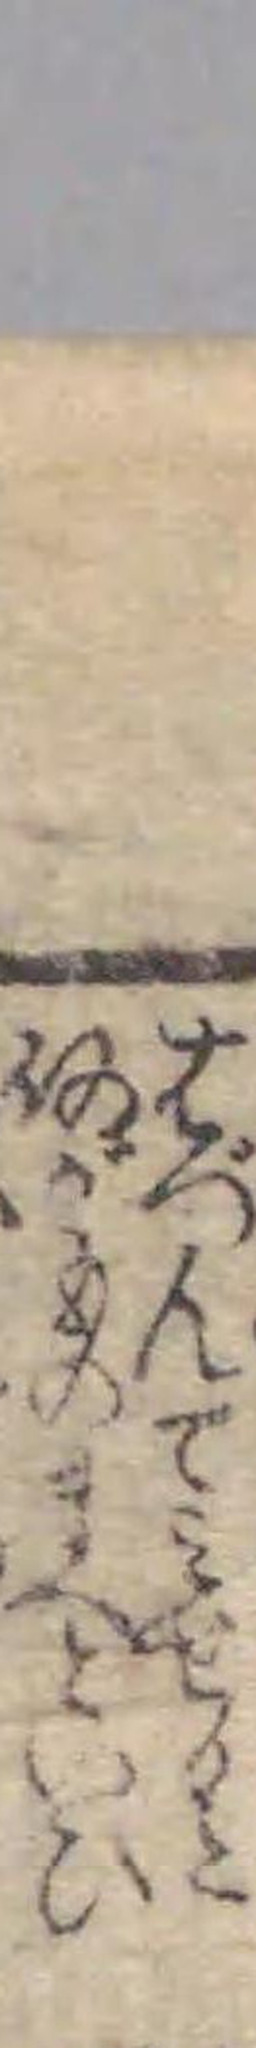何がものまへといひ
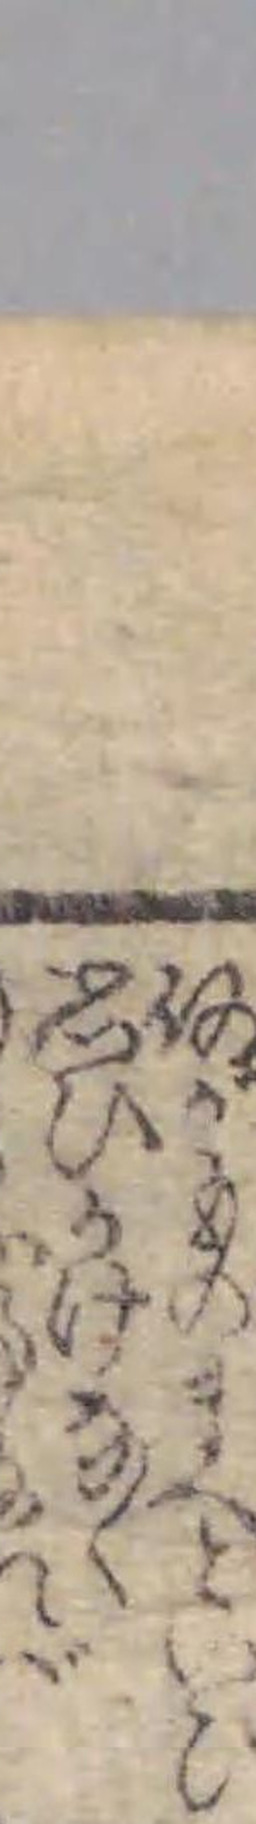思ひかけなく
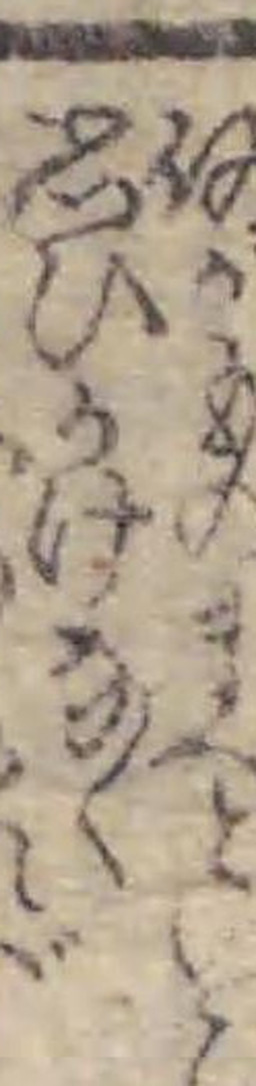思ひかけなく
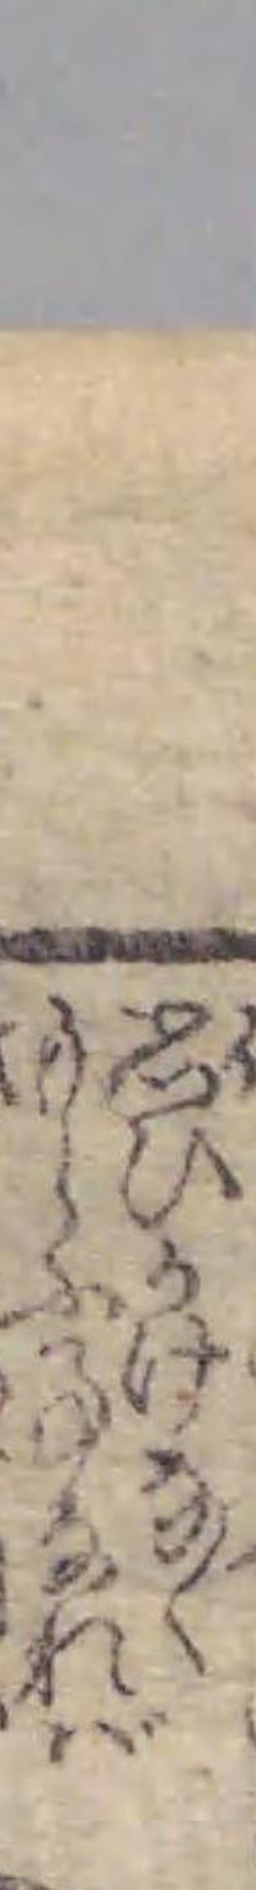もらふ事なれば
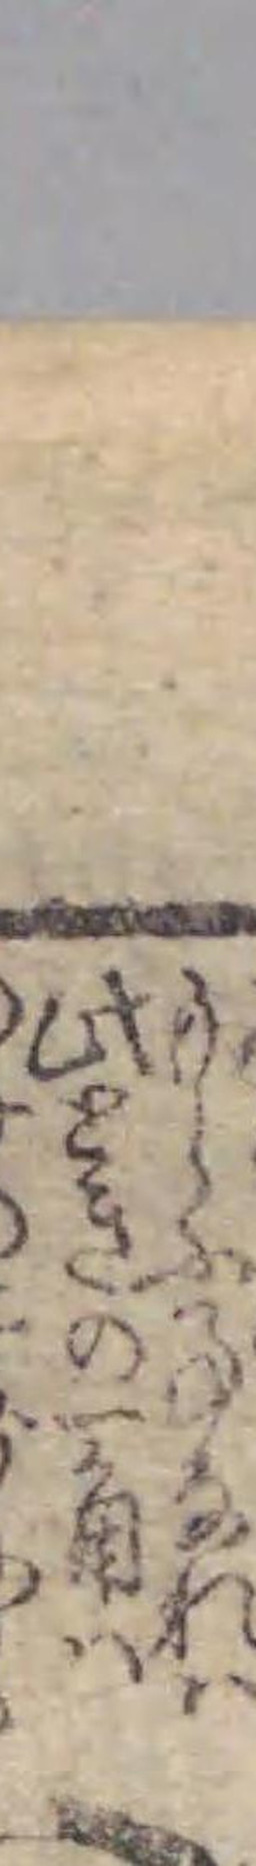此ときの一角は
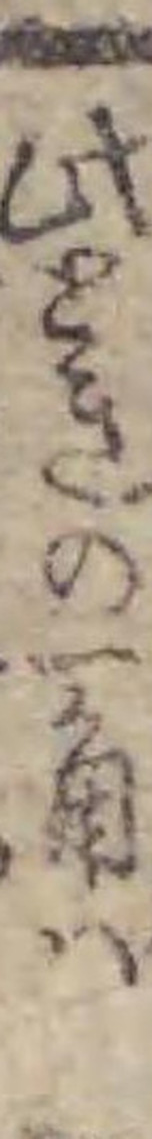此ときの一角は
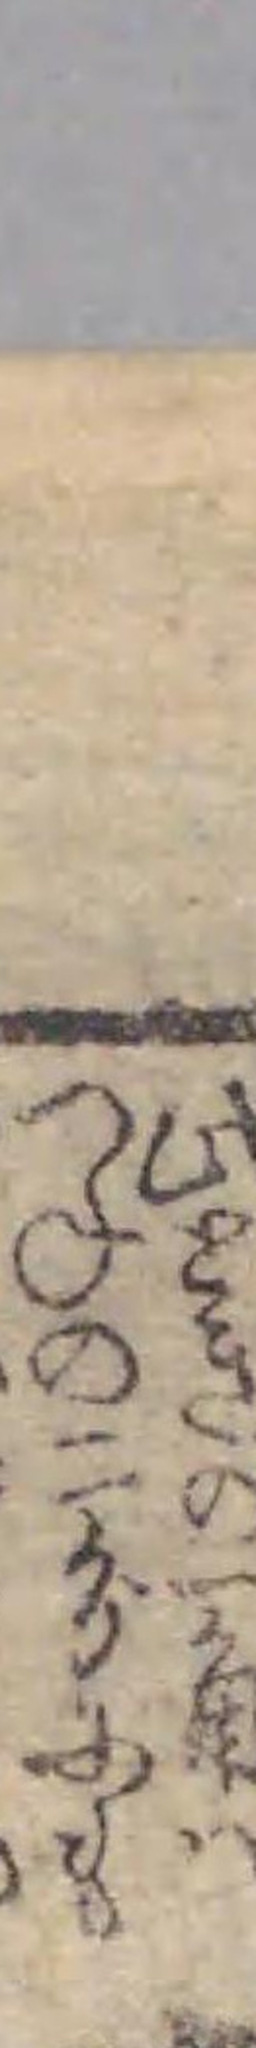つねの二分にも
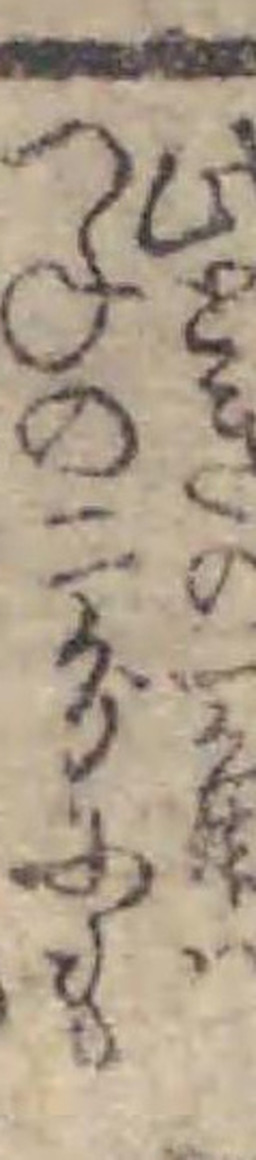つねの二分にも
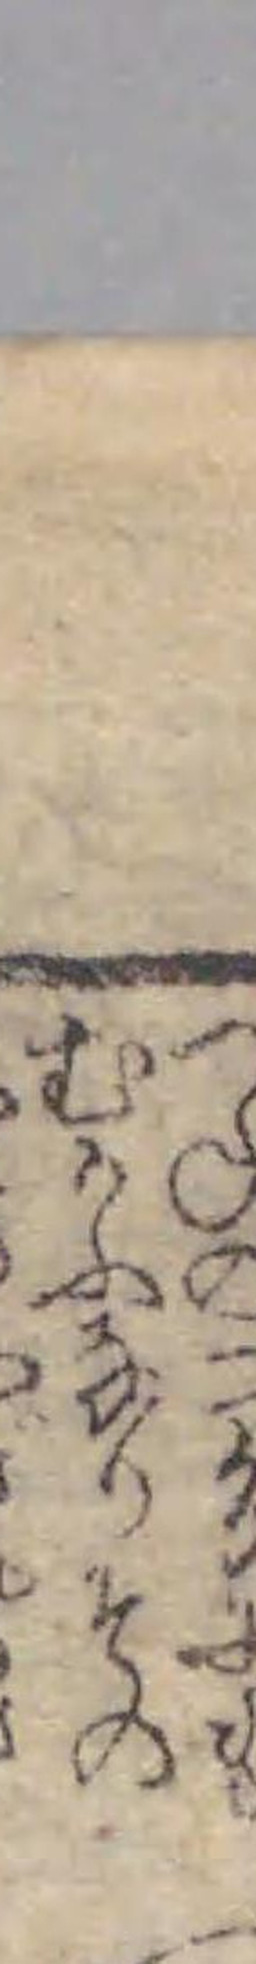むかふなりその
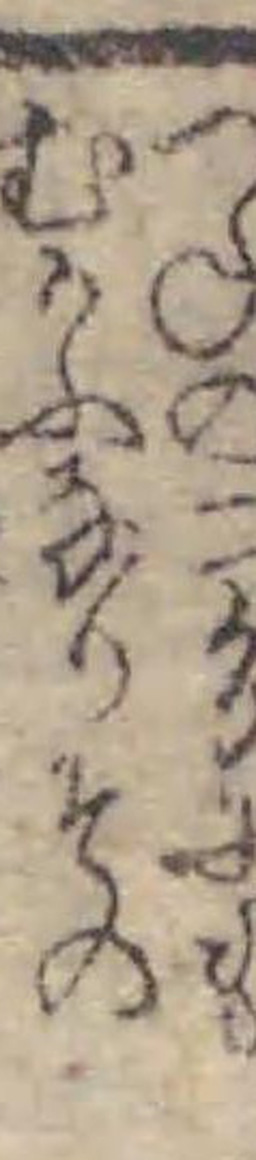むかふなりその
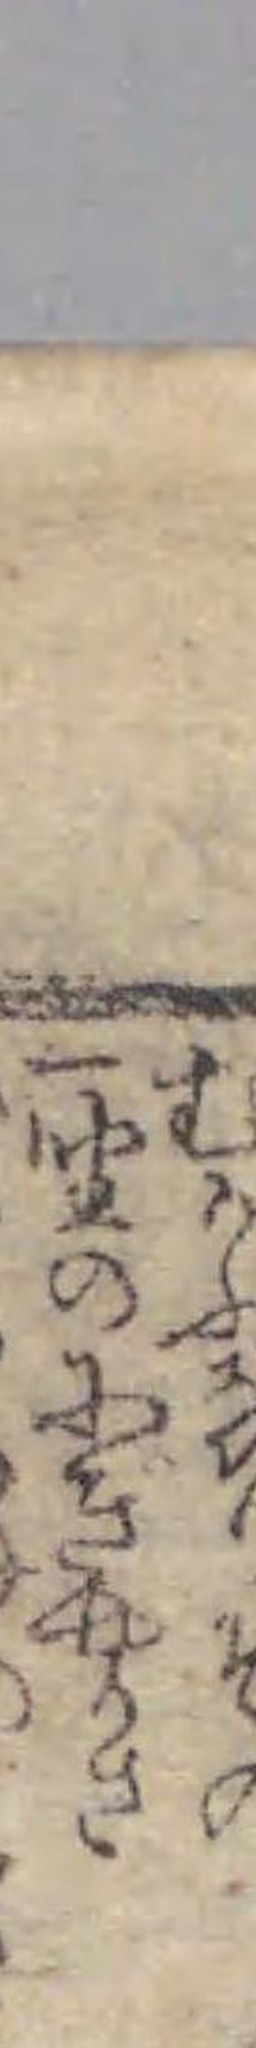一坐のにぎやかさ
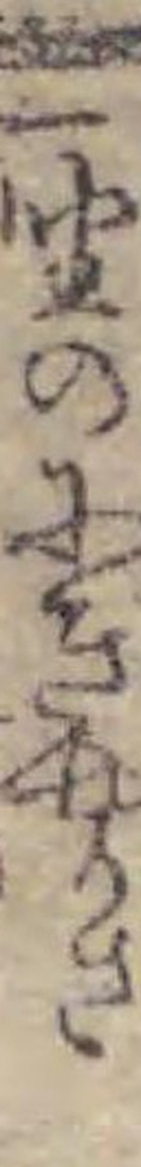一坐のにぎやかさ
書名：新鋳小判 : 3巻
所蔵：国立国会図書館 National Diet Library, JAPAN
